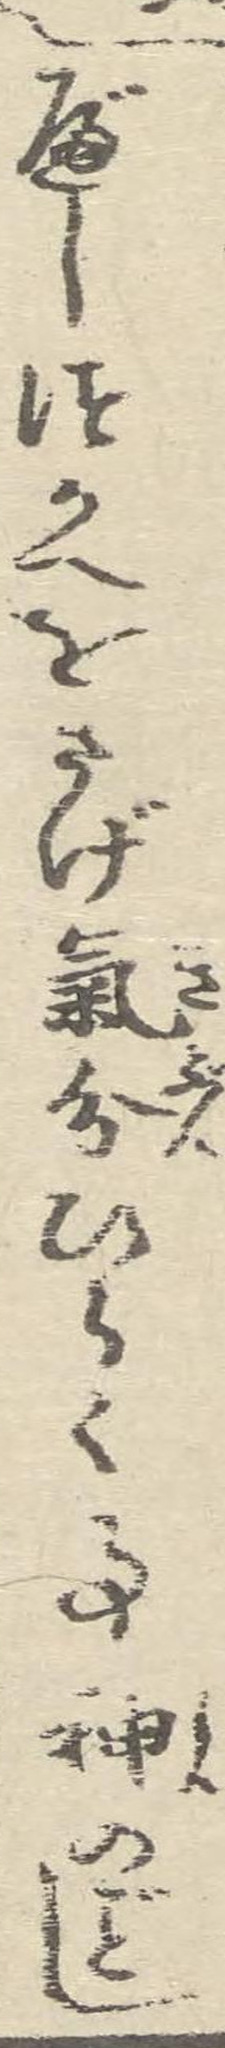べしつかへをさげ気分ひらく事神のごとし
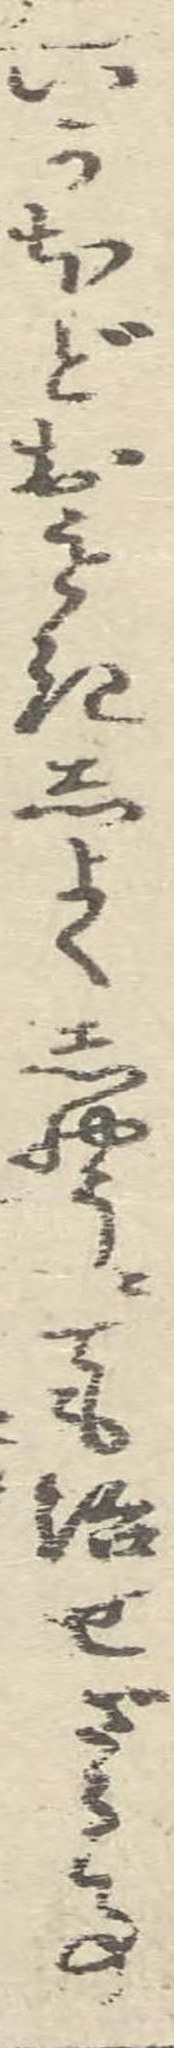いかほどおもきしよくしやうにても治せざる事
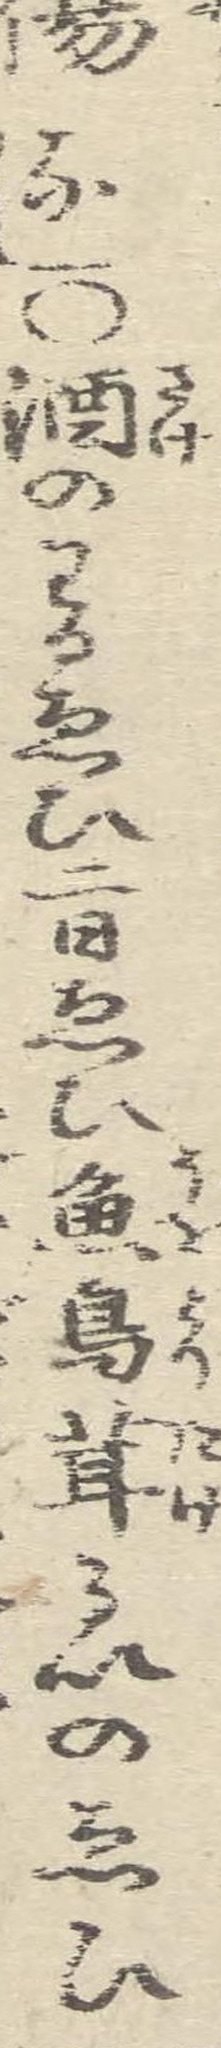なし〇酒のわるゑひ二日ゑひ魚鳥茸るいのゑひ
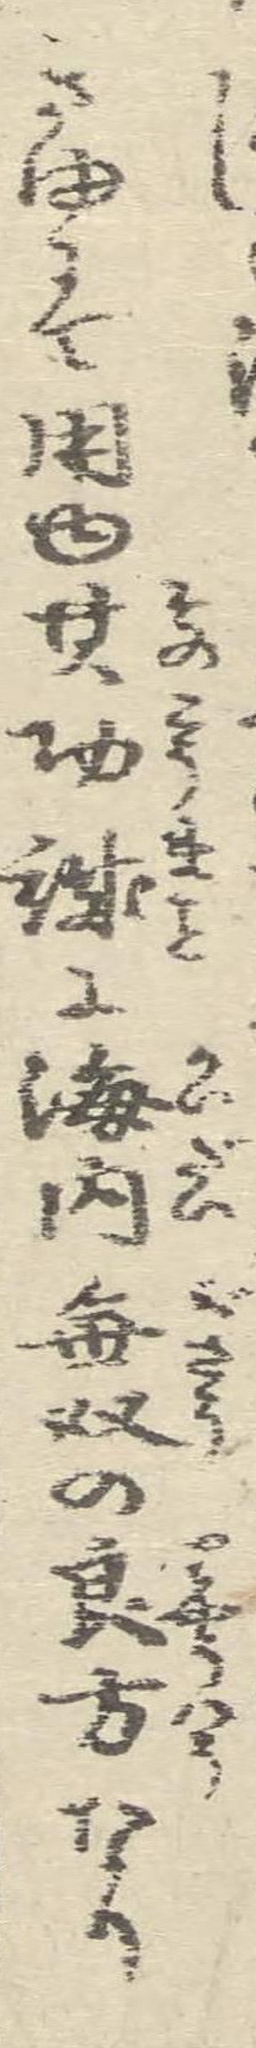さゆにて用ゆ其功誠に海内無双の良方なり
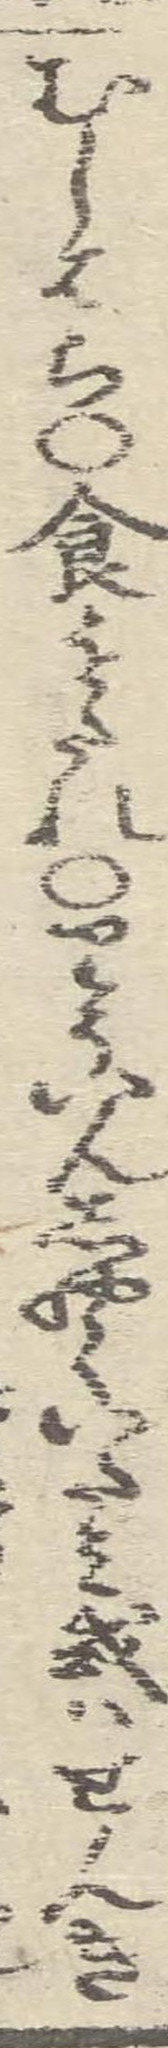むしはら〇食もたれ〇りういんしやくいたみ或はせんき
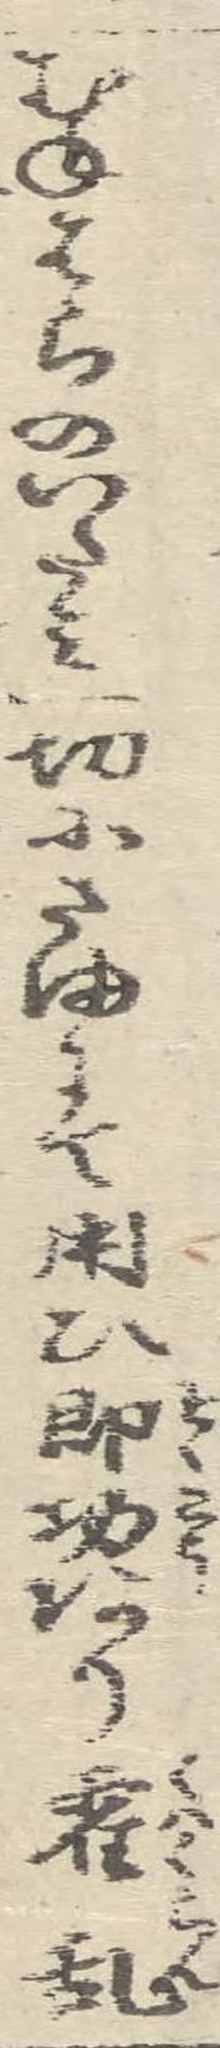むねはらのいたみ一切にさゆにて用ひ即功あり霍乱
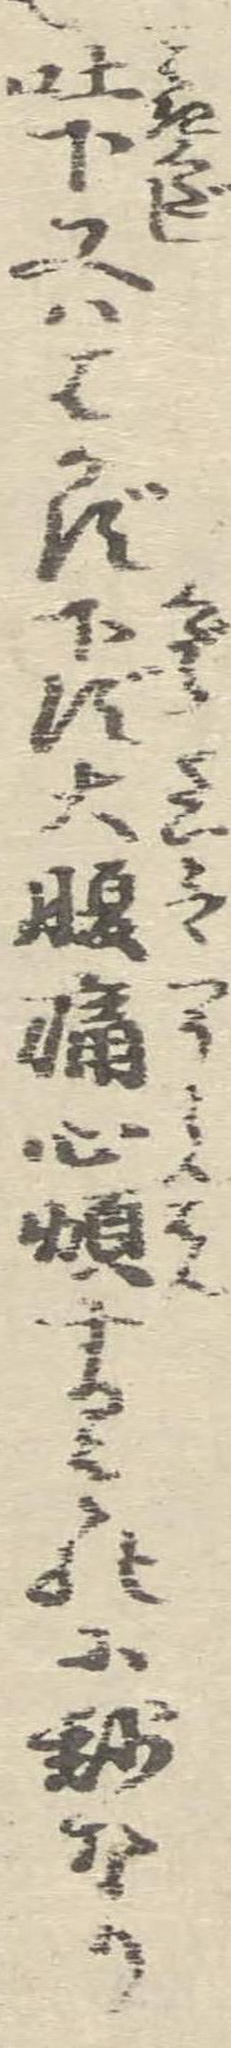吐下又ははかず下ず大腹痛心煩するものに妙なり
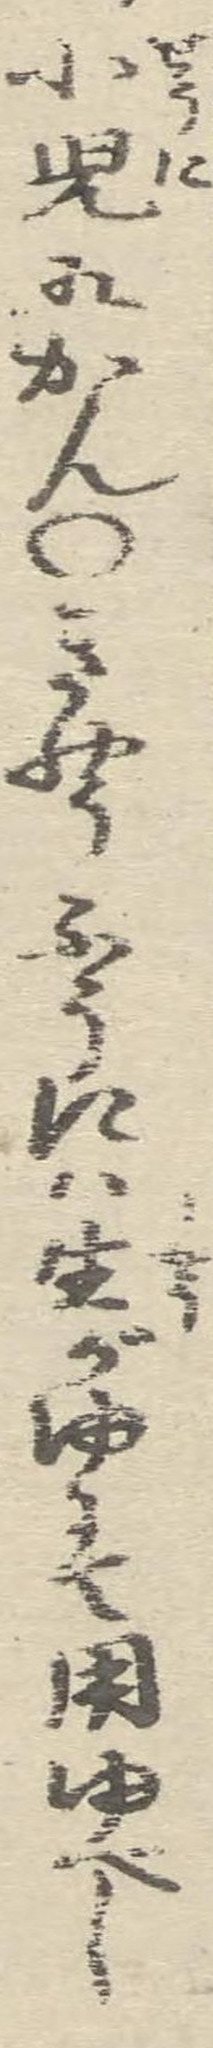小児五かん〇きやうふうには生がゆにて用ゆべし
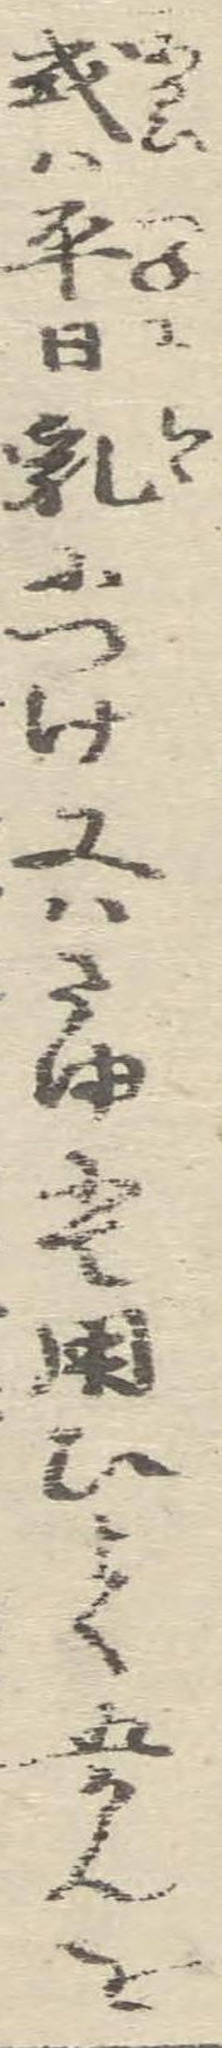或は平日乳につけ又はさゆにて用ひよく五かんを
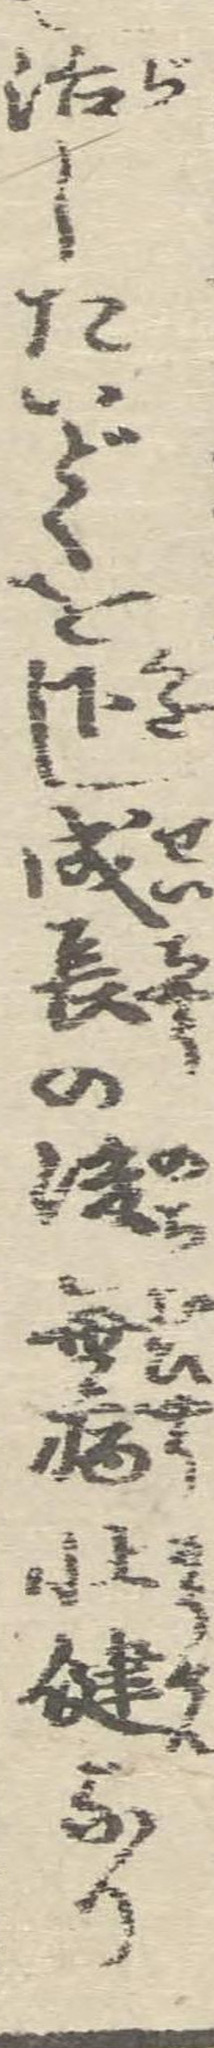治したいどくを下し成長の後無病壮健なり
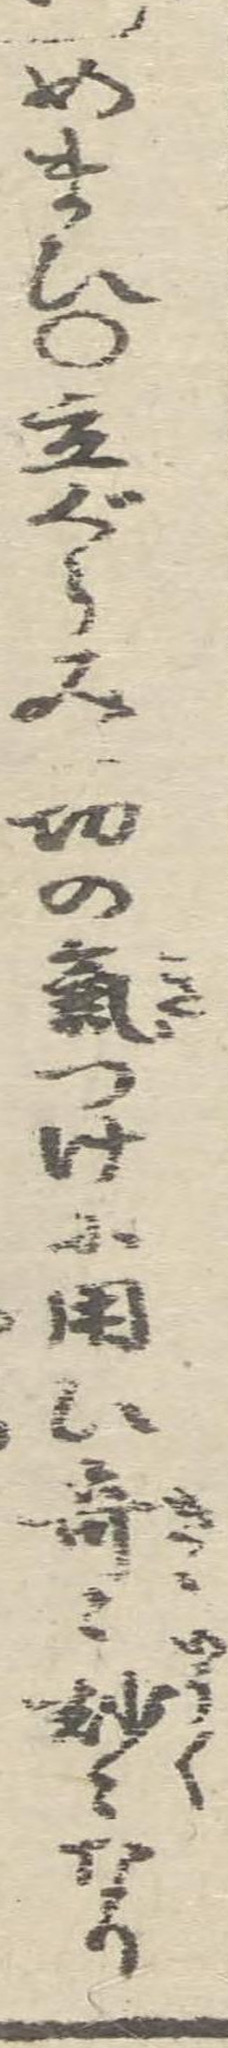めまひ〇立ぐらみ一切の気つけに用ひ奇々妙々なり
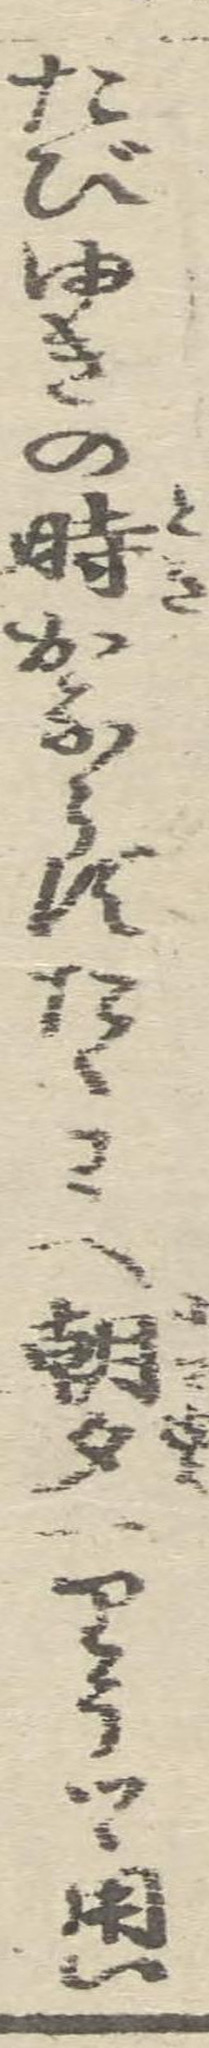たびゆきの時かならずたくわへ朝夕一りうつゝ用い
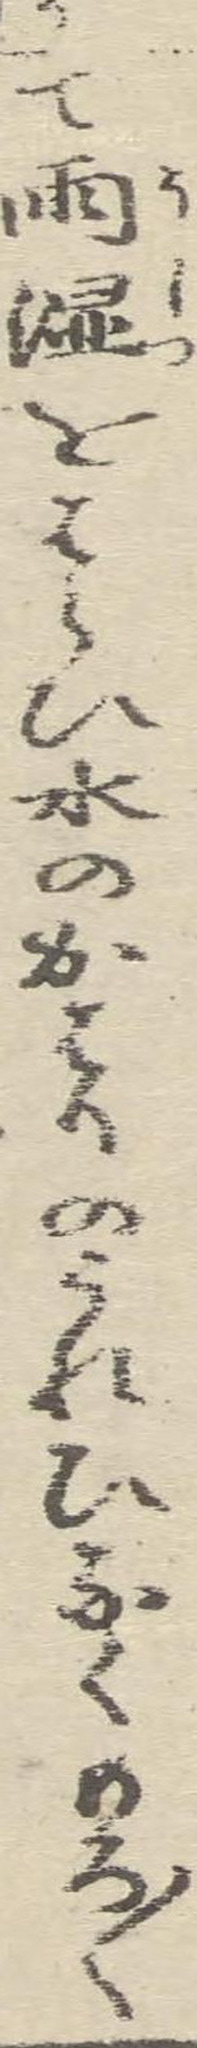て雨湿をはらひ水のかはりのうれひなくもろ〳〵
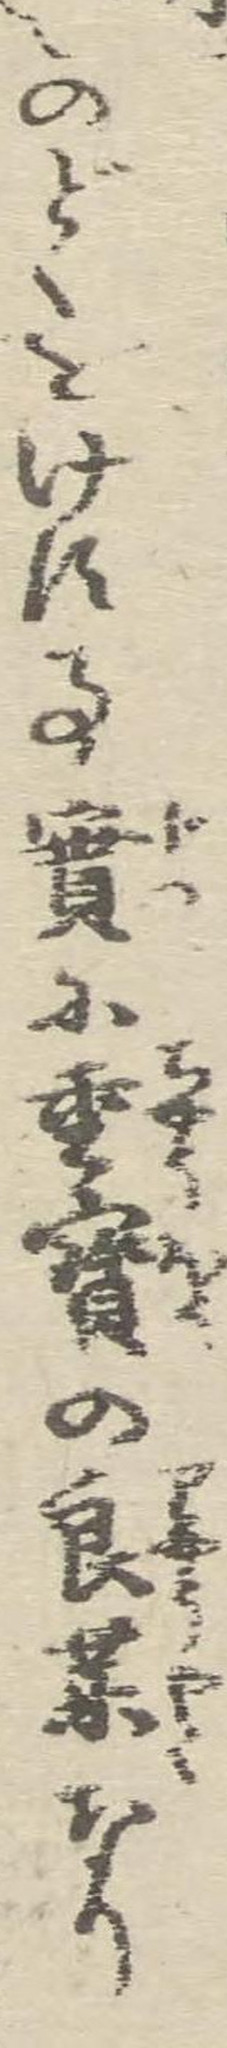のどくをけす事実に重宝の良薬なり
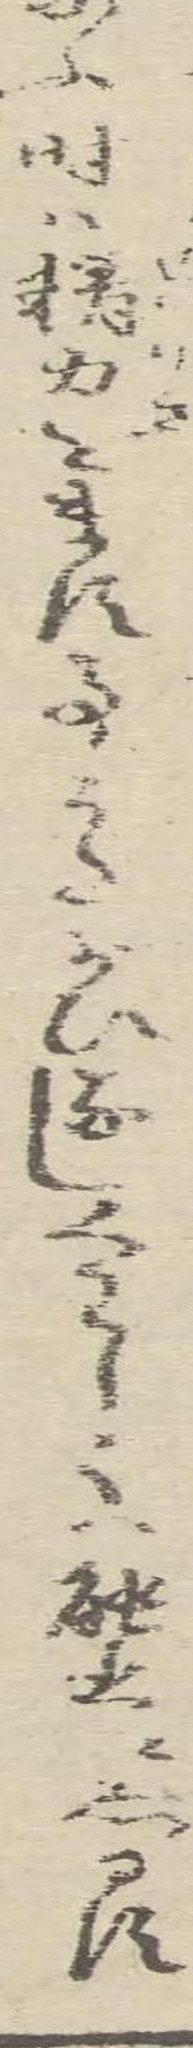なふ時は精力をます事うたがひなしくわしくは能書にしるす

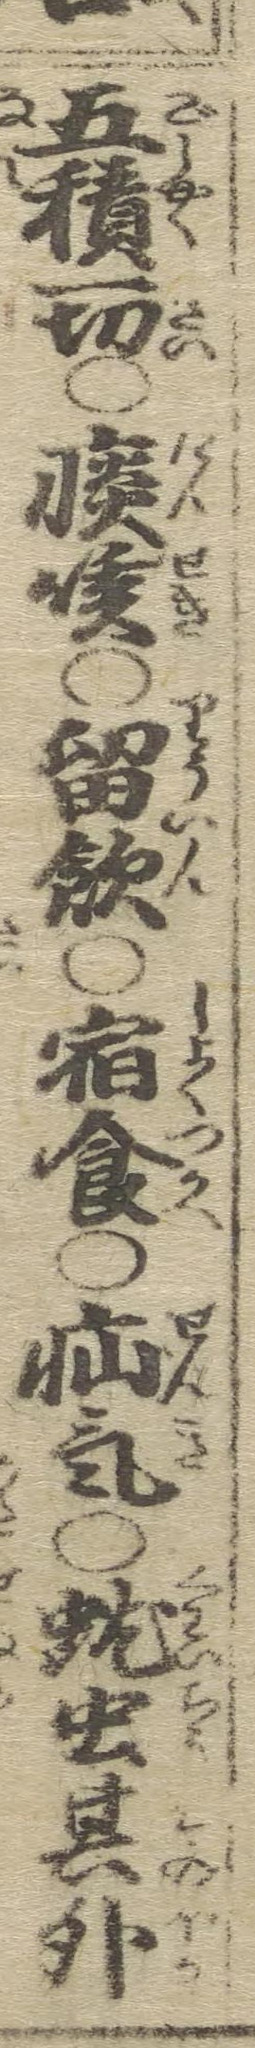五積一切〇痰咳〇留飲〇宿食〇疝気〇蚘虫其外
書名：浪華薬種問屋能書張交帖. 二
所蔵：国立国会図書館 National Diet Library, JAPAN
